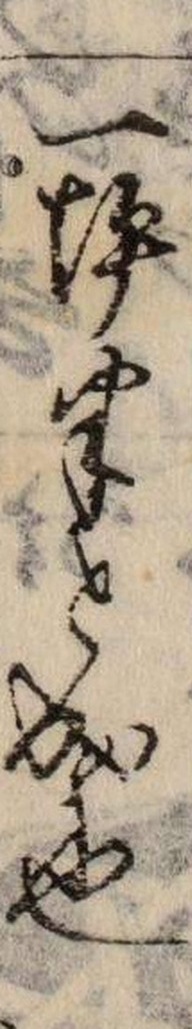一間半と成也
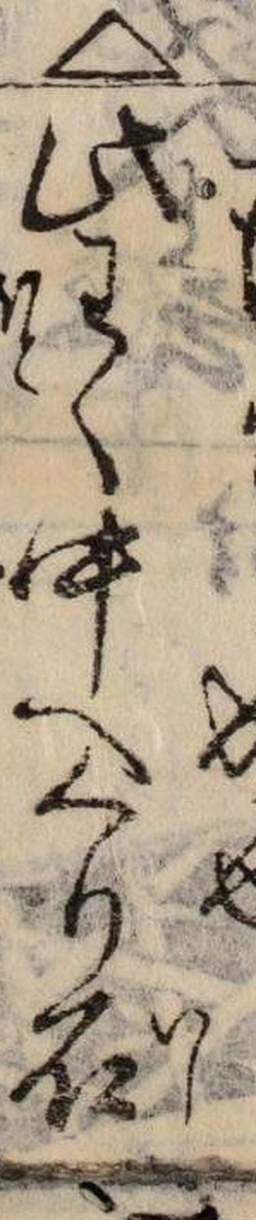△此わく中へくり石
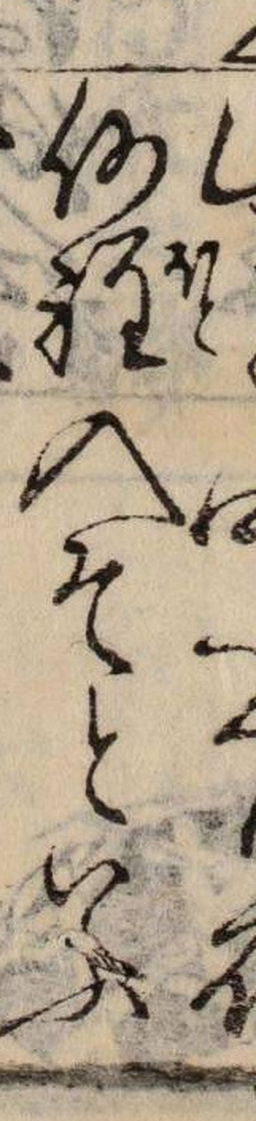何程入そといふ
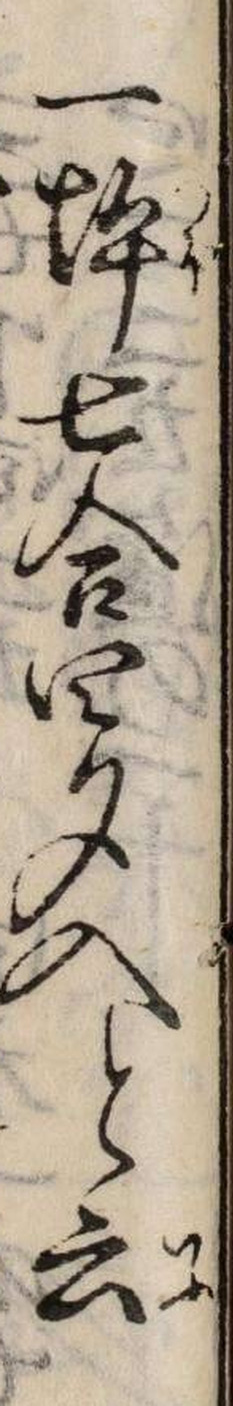一坪七合四勺入と云
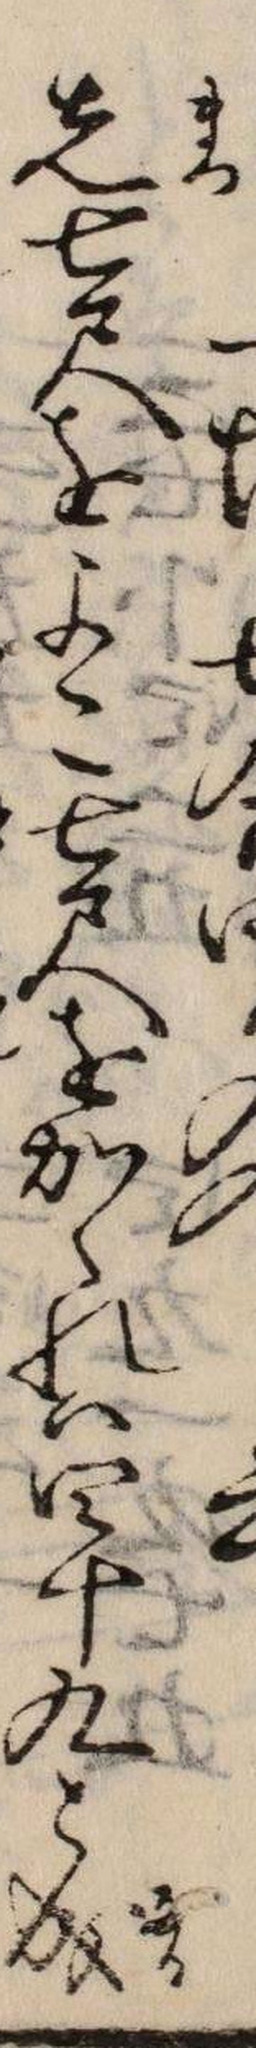先七尺をよこ七尺をかくれは四十九と成
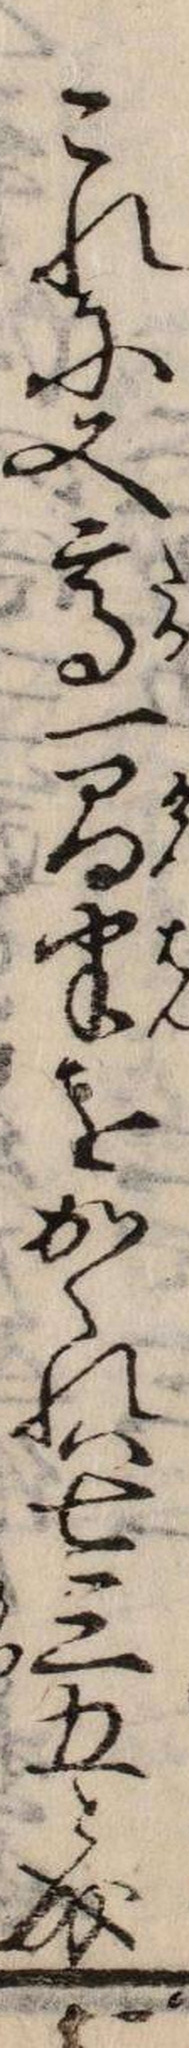これに又高一間半をかくれは七三五と成
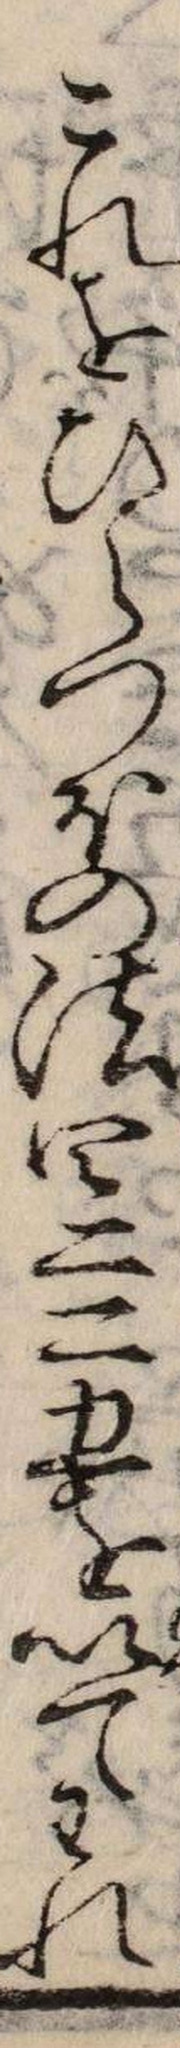これをひらつほの法四二二五を以てわれ
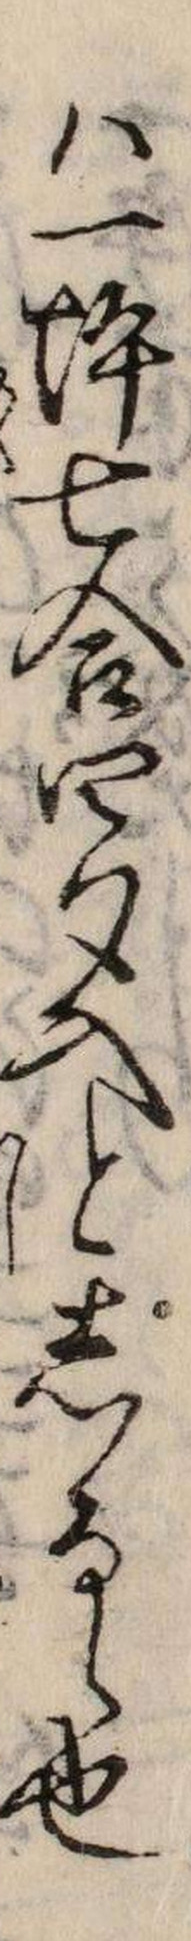は一坪七合四勺入としるる也
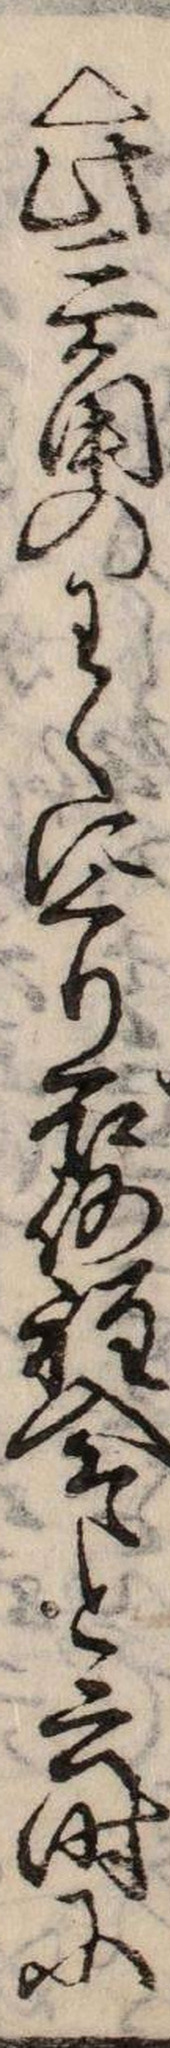△此三角のわくにくり石何程入そと云時に
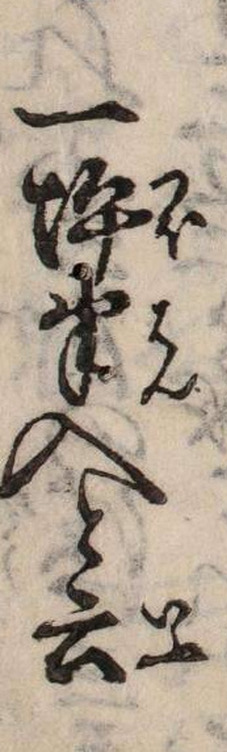一坪半入と云

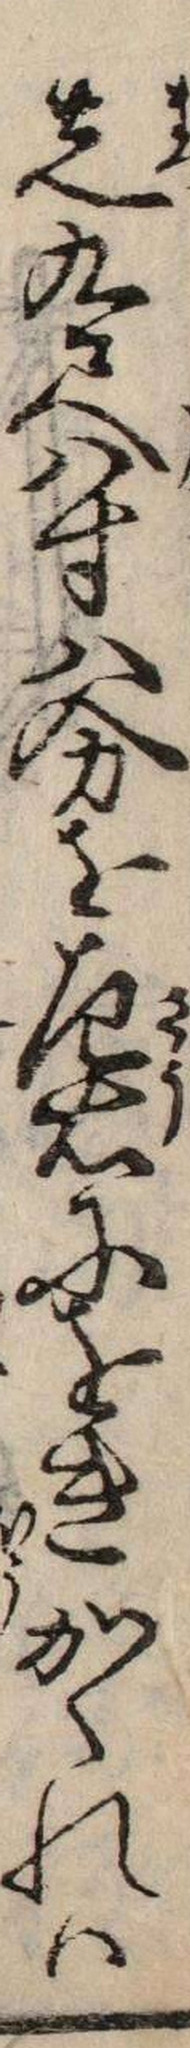先九尺八寸八分を左右にをきかくれは
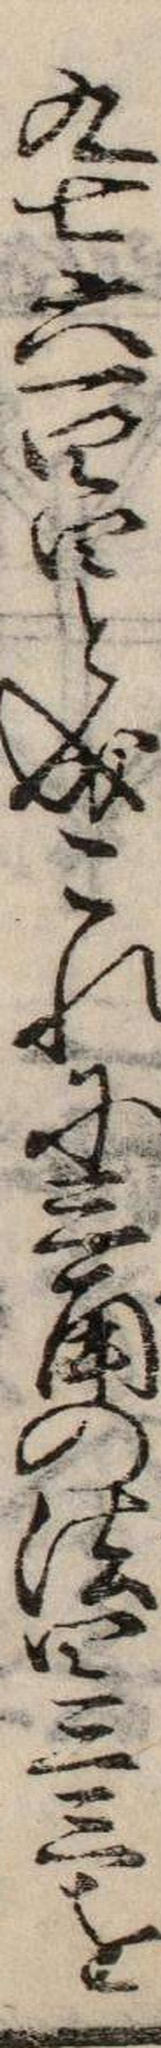九七六一四と成これに三角の法四三三を
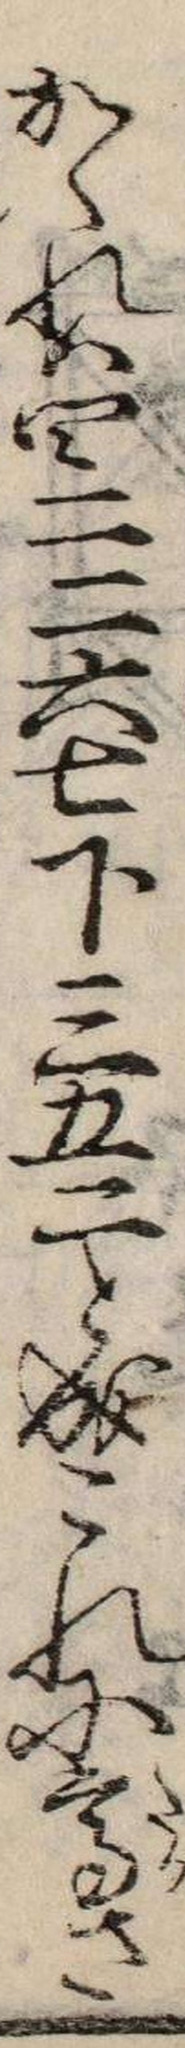かくれは四二二六七下三五二と成これに高さ
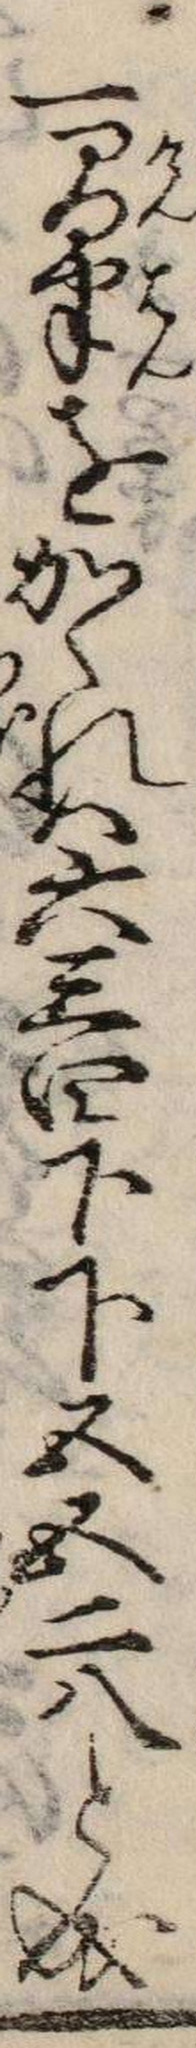一間半をかくれは六三四下下五五二八と成
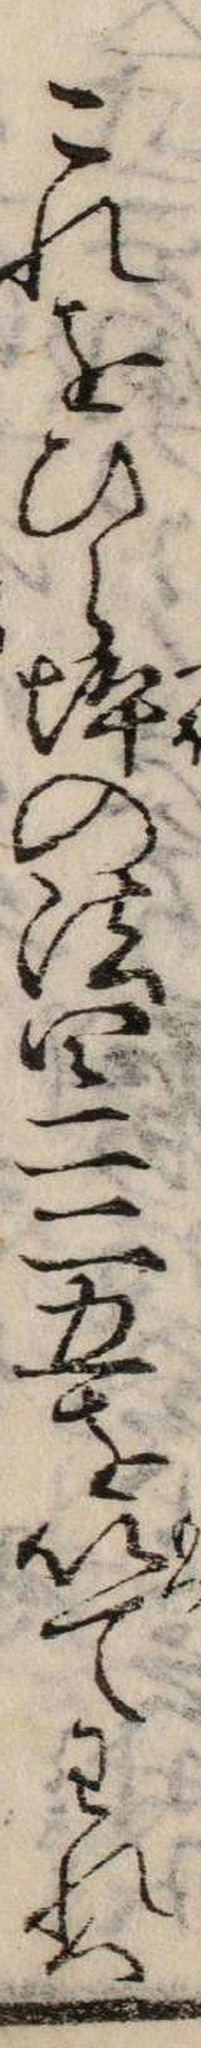これをひら坪の法四二二五を以てわれは
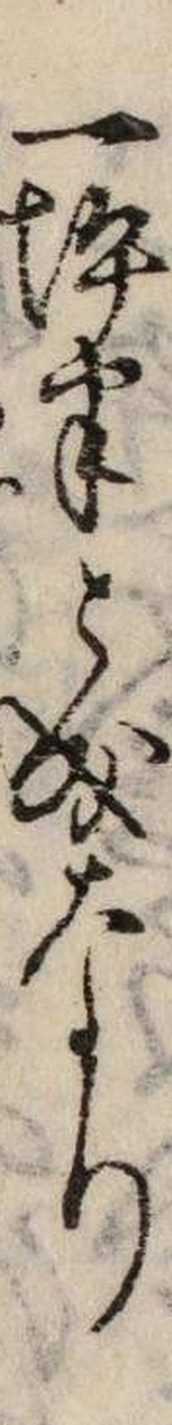一坪半と成なり
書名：塵劫記（寛永11年自跋、京都府立京都学・歴彩館追貴8）
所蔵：京都府立京都学・歴彩館 国文学研究資料館
